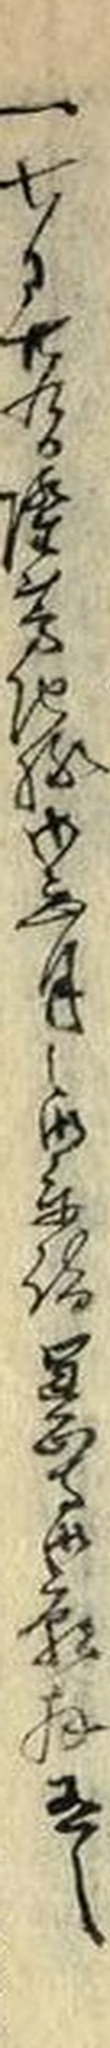一七月廿九日隆芳院様御忌月之御参詣運正寺御廟拝有之
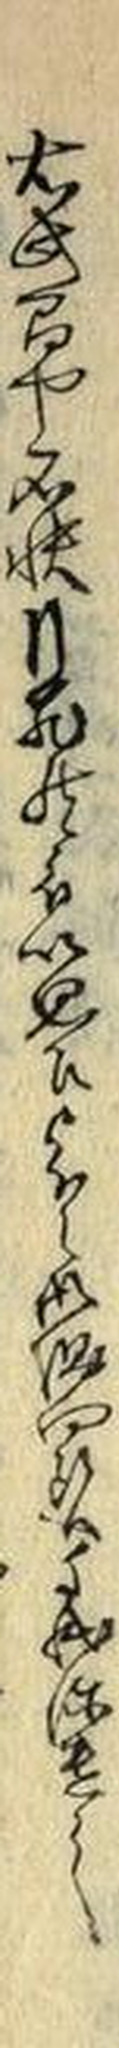右此間中不快引籠居候ニ付以思召被下之御側向頭取手紙添遣之
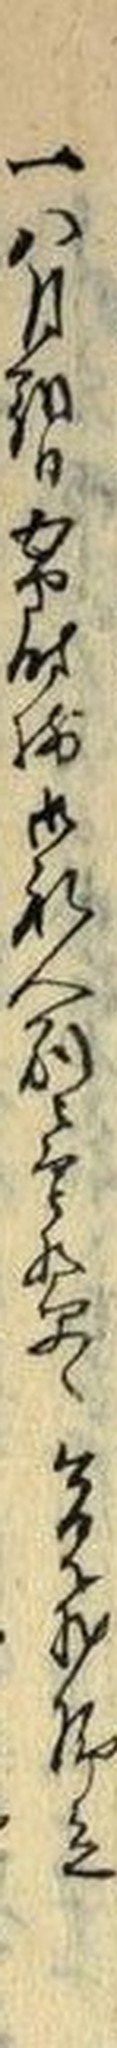一八月朔日五半時揃御礼人別ニ而被為受候今日飛脚立
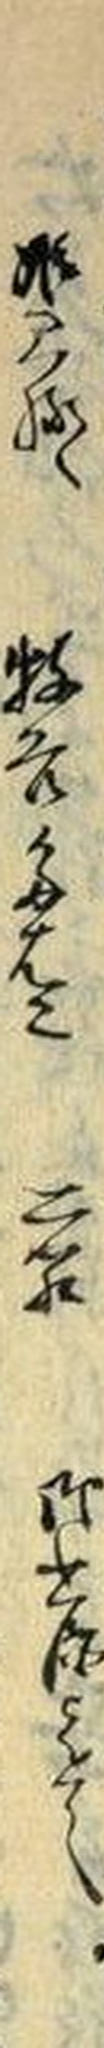姫君様へ牧谷たばこ二箱御書添被進之
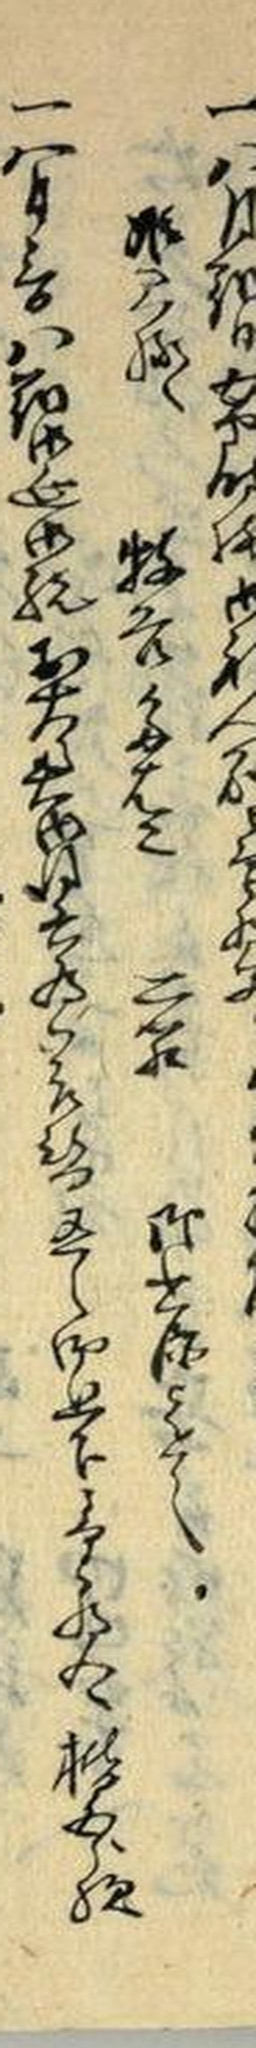一八月三日八朔御延御祝於大奥御目六為御取替有之御上下ニ而被為入候揩五郎様
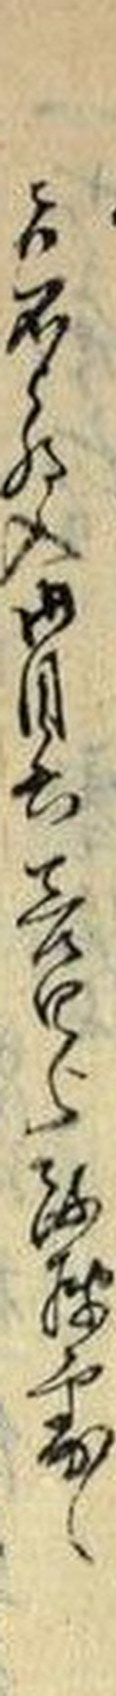ニハ不被為入御目六善四郎致披露候
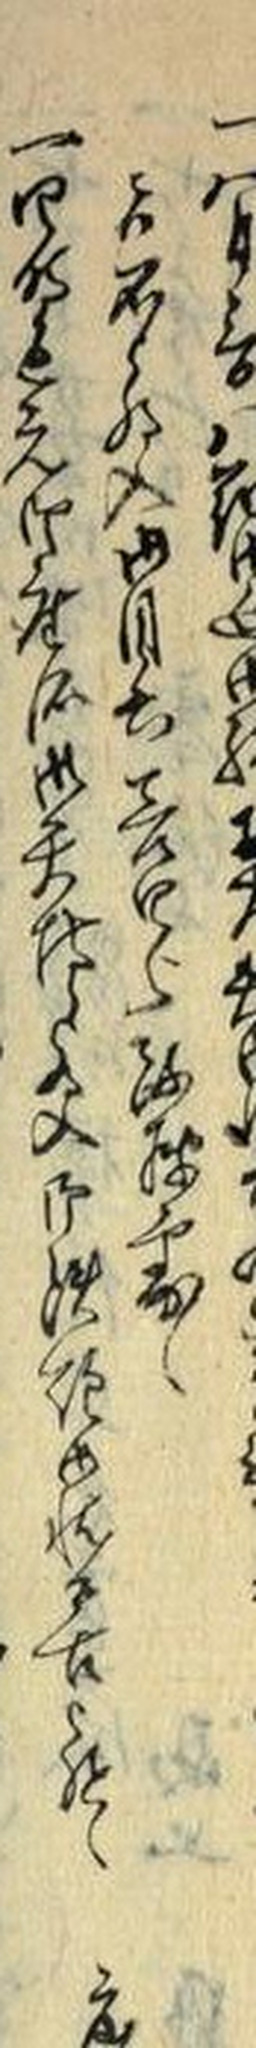一四時過元御座所御矢場へ被為入御鉄炮御稽古被遊候度々
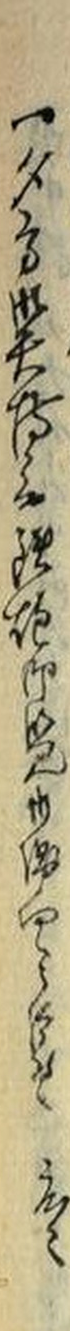一夕方御矢場ニ而鉄炮御覧御側向へ被仰付候度々
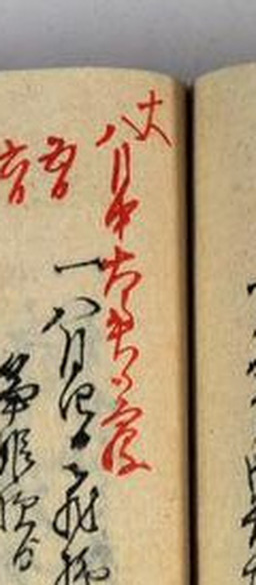八月中大奥御寝
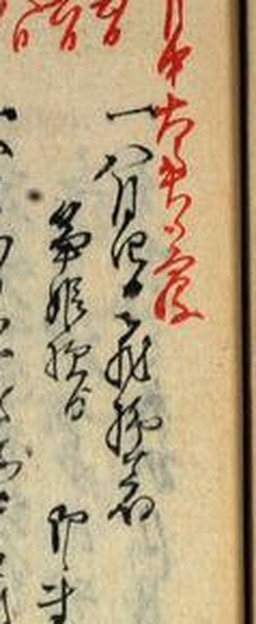一八月四日飛脚着
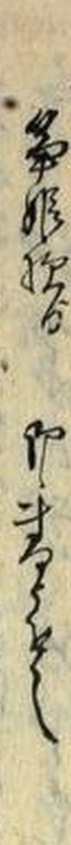箏姫様ゟ御書被進之
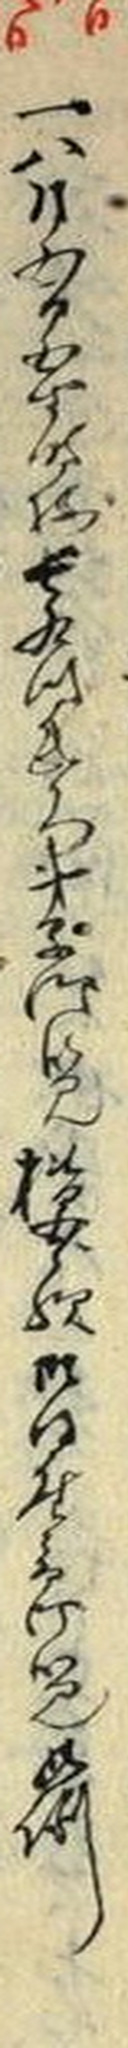一八月五日五半時揃長谷川武右衛門弟子御覧揩五郎様御同座ニ而御覧如例
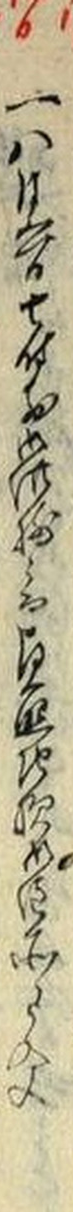一八月六日七時前御供揃ニ而貞照院様御住所へ被為入
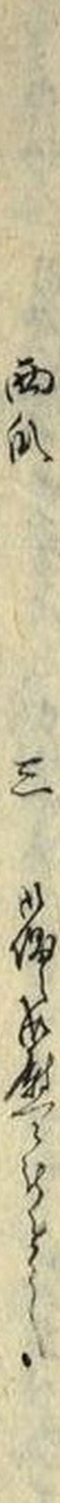西瓜三御側御慰ニ被進之
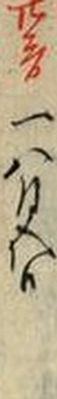一八月十日
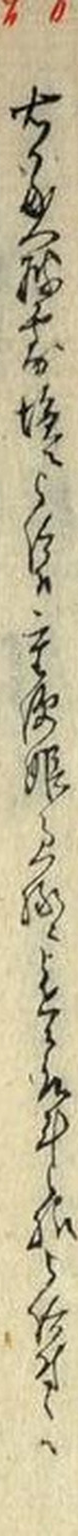右御用人披露塩ニ被仰付重便姫君様ニ被進ニ取斗候様被仰付候
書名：少傅日録抄（斉承付側向頭取日記、在国）
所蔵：福井県文書館 Fukui Prefectural Archives
